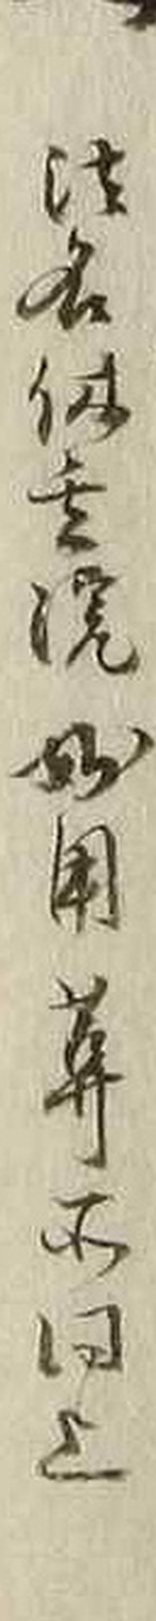法名休玄院妙用そ葬所同上
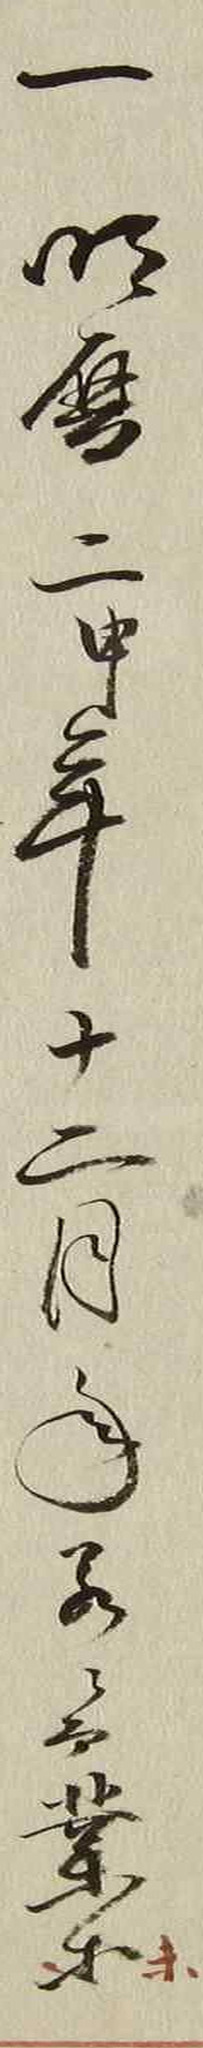一明暦二申年十二月年若ニて業等
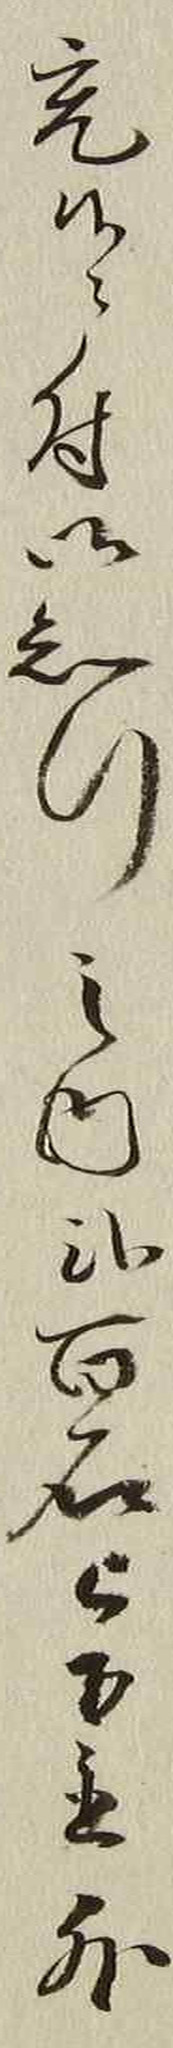充候ニ付き御知行内弐百石下し置かれ外
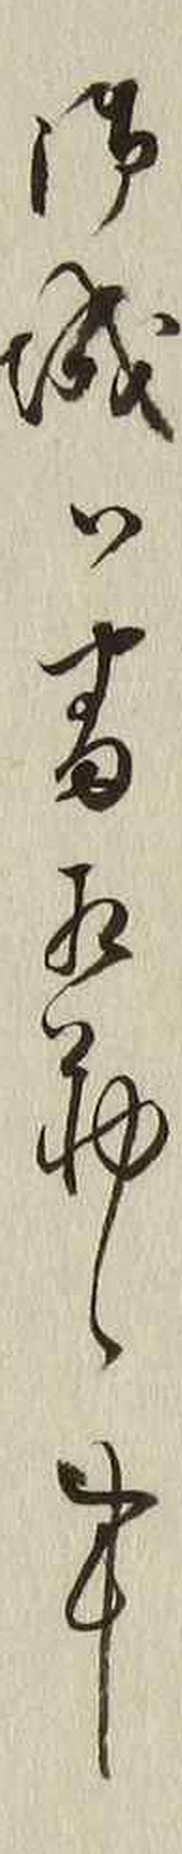御城御書相勤め候事
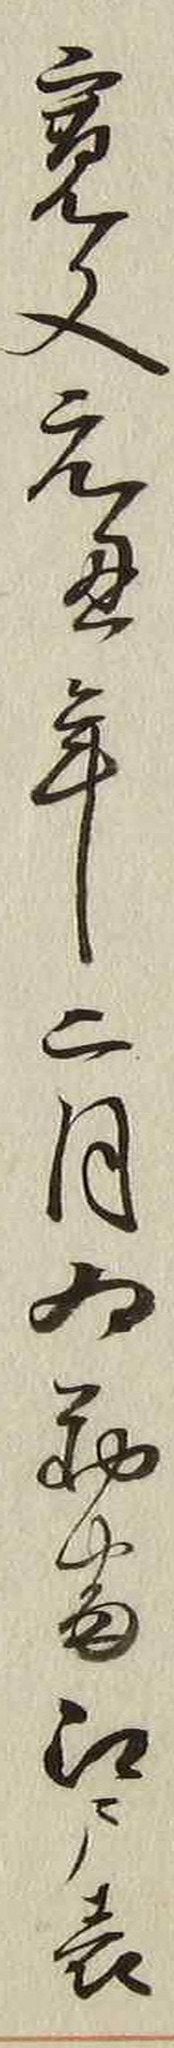一寛文元丑年二月勤番之為江戸表
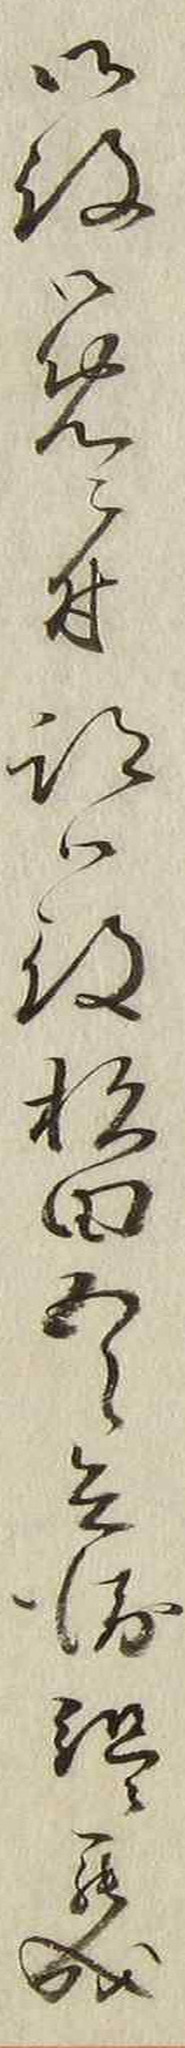御役御免ニ付き跡御役杉田五郎兵衛組ニ罷り成り
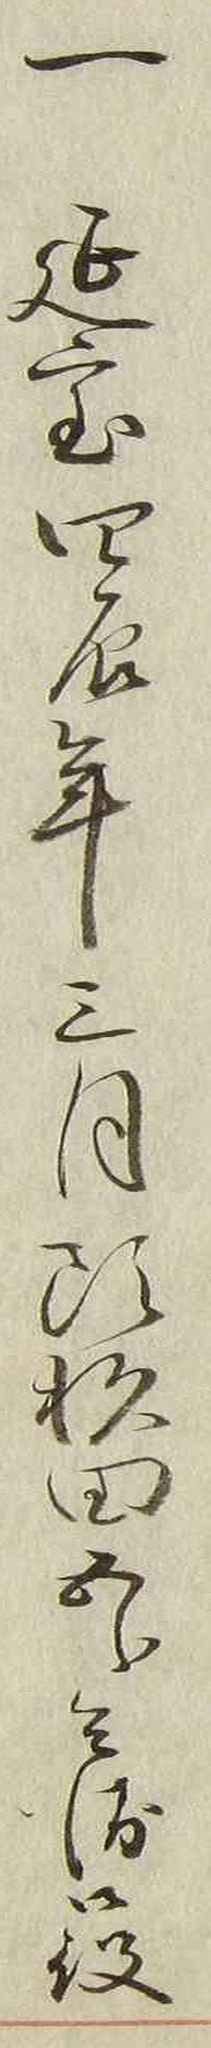一延宝四辰年三月頃杉田五郎兵衛御役

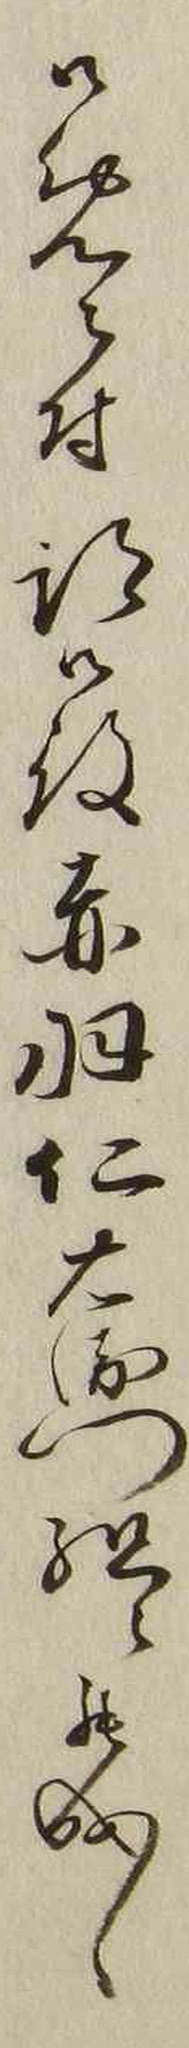御免ニ付き跡御役赤羽仁右衛門組ニ罷り成り候
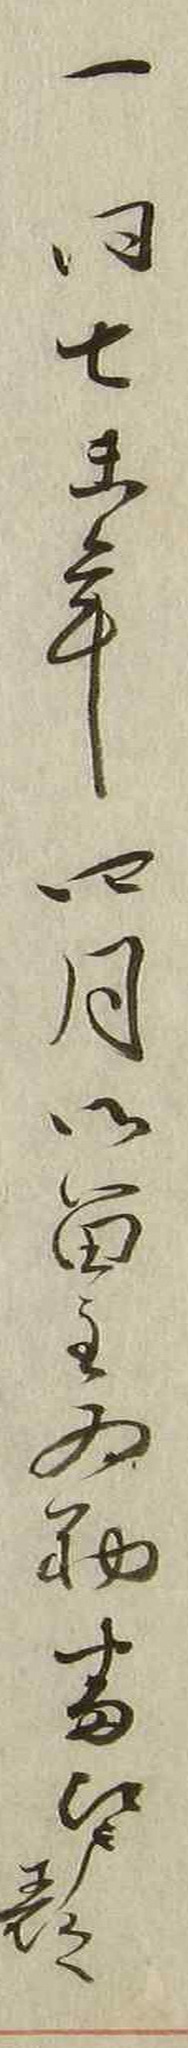一同七未年四月御留主勤番之為江戸表へ
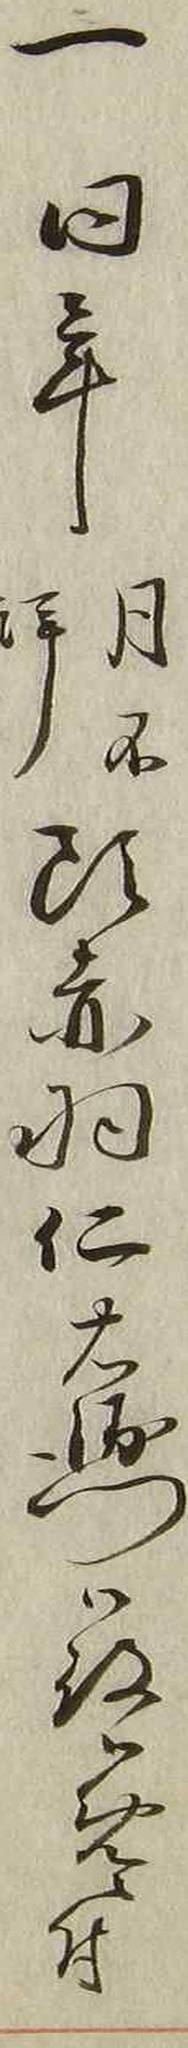一同年月不詳頭赤羽仁右衛門御役御免ニ付き
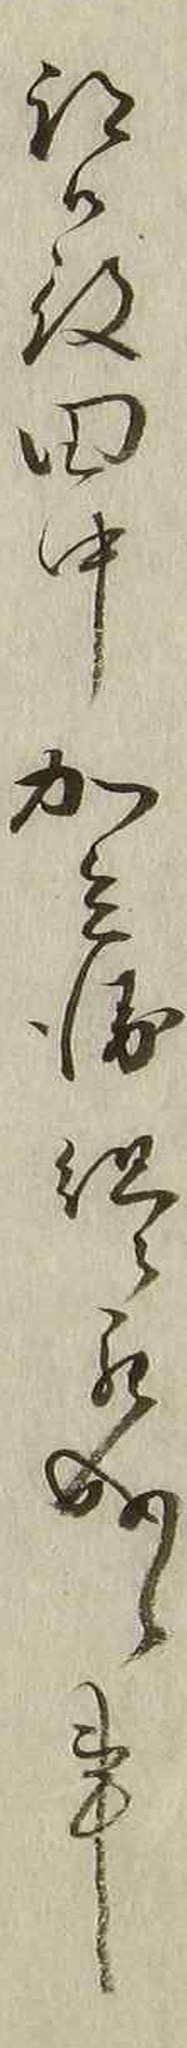跡御役田中加兵衛組ニ罷り成り候事
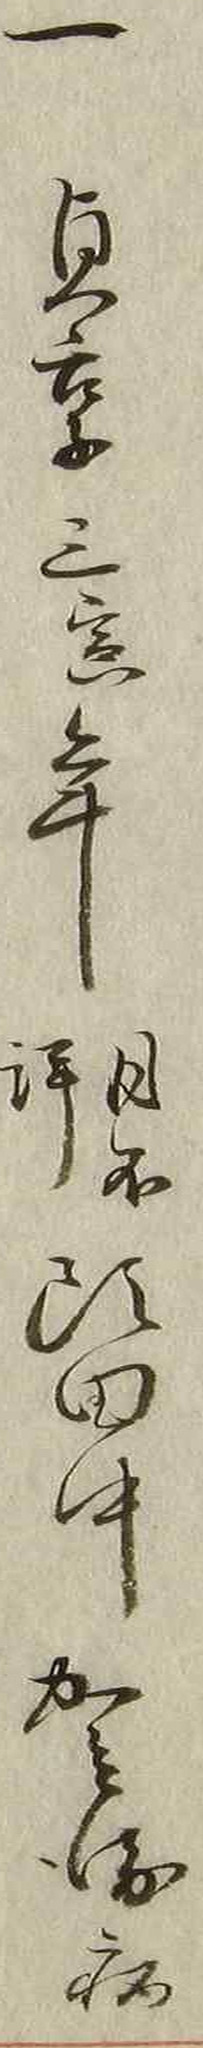一貞享三寅年月不詳頭田中加兵衛病
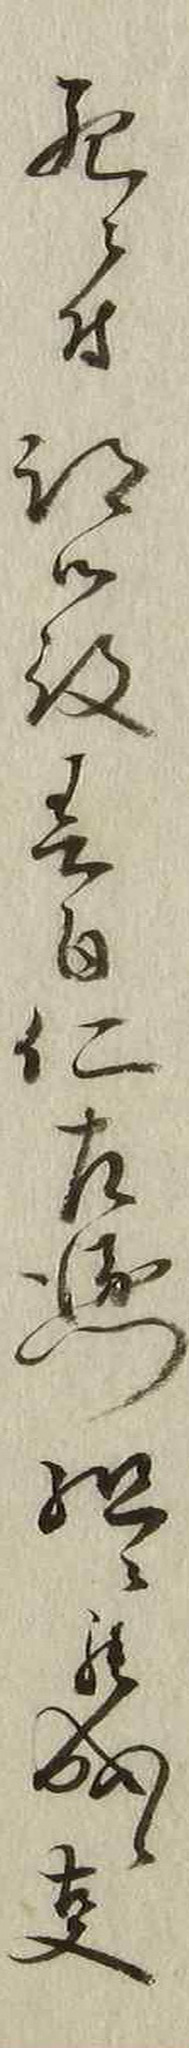死ニ付き跡御役春日仁左衛門組ニ罷り成り候事
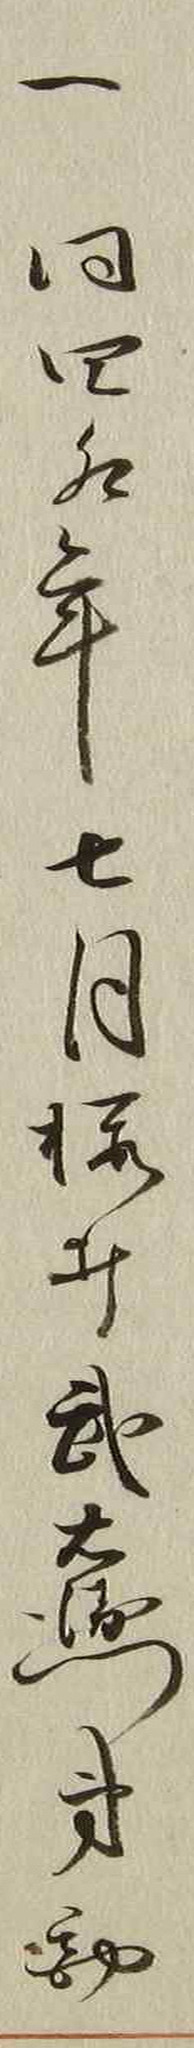一同四卯年七月桜井武右衛門弟勘
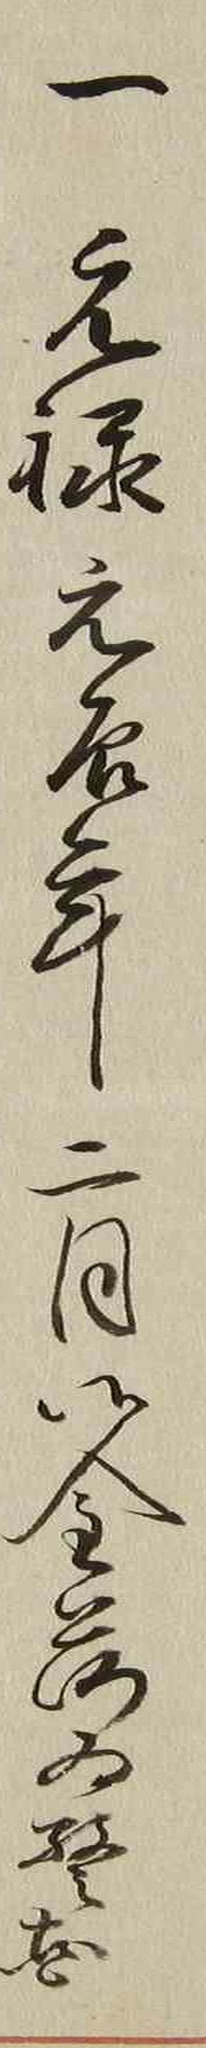一元禄元辰年二月御金荷警固の為
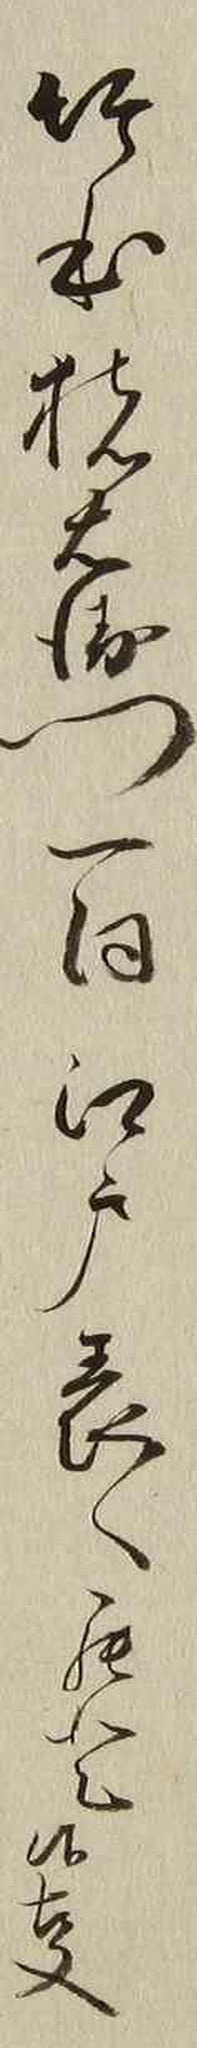竹本杭右衛門一同江戸表へ罷り登り候事
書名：諸士系譜　巻之20　い之部20
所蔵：会津若松市立会津図書館
